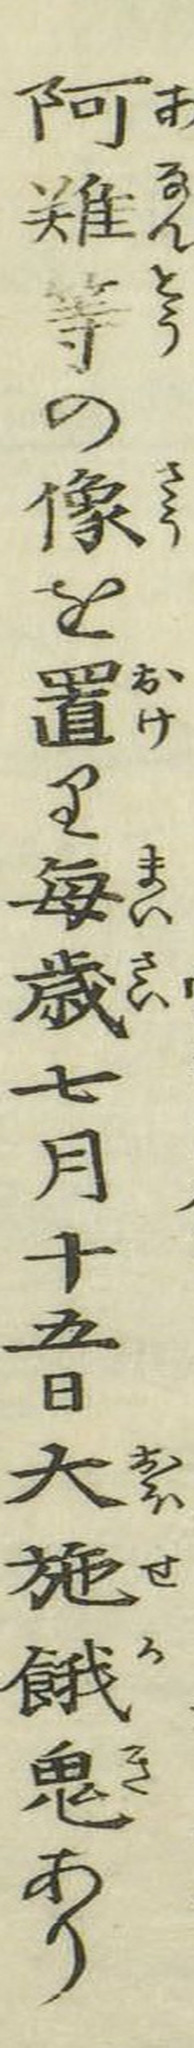阿難等の像を置り毎歳七月十五日大施餓鬼あり
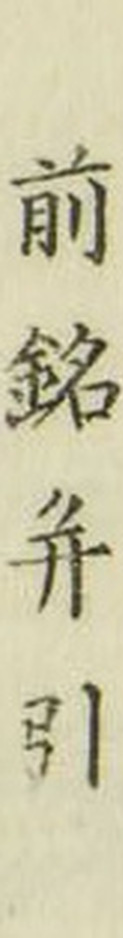前銘弁引
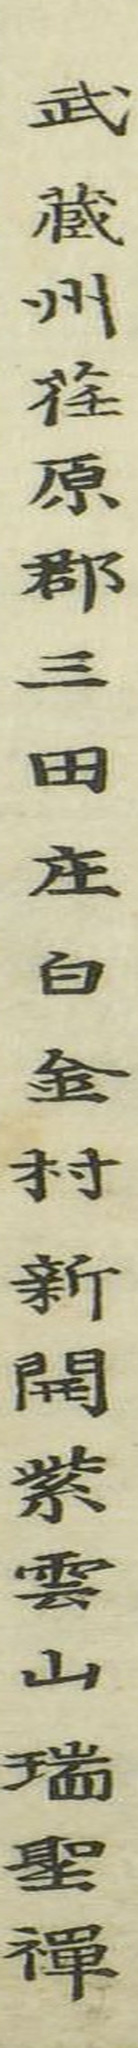武藏州荏原郡三田庄白金村新開紫雲山瑞聖禪

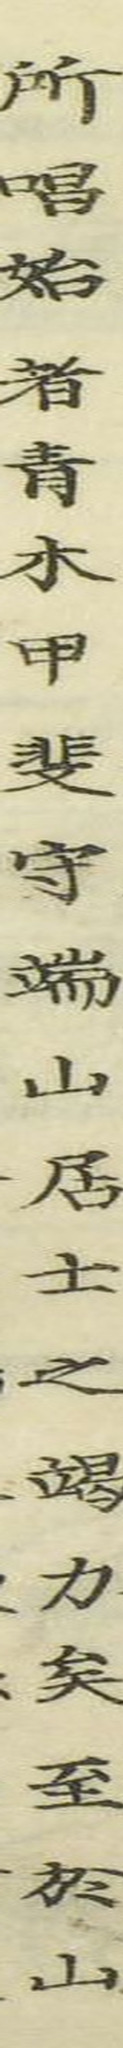所唱始者青木甲斐守端山居士之竭力矣至於山
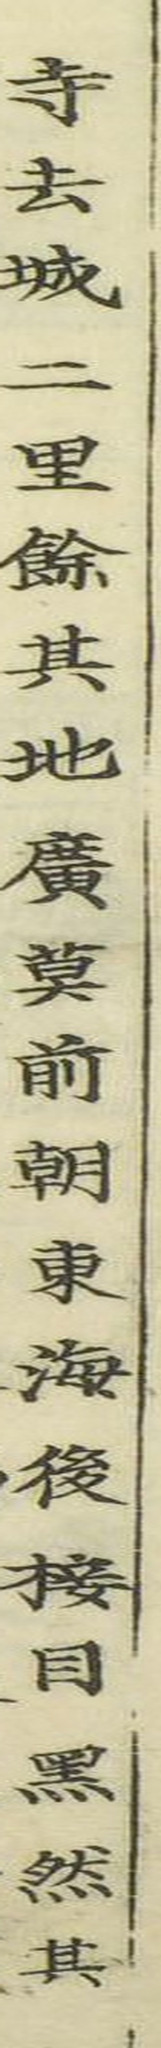寺去城二里餘其地廣莫前朝東海後接目黑然其
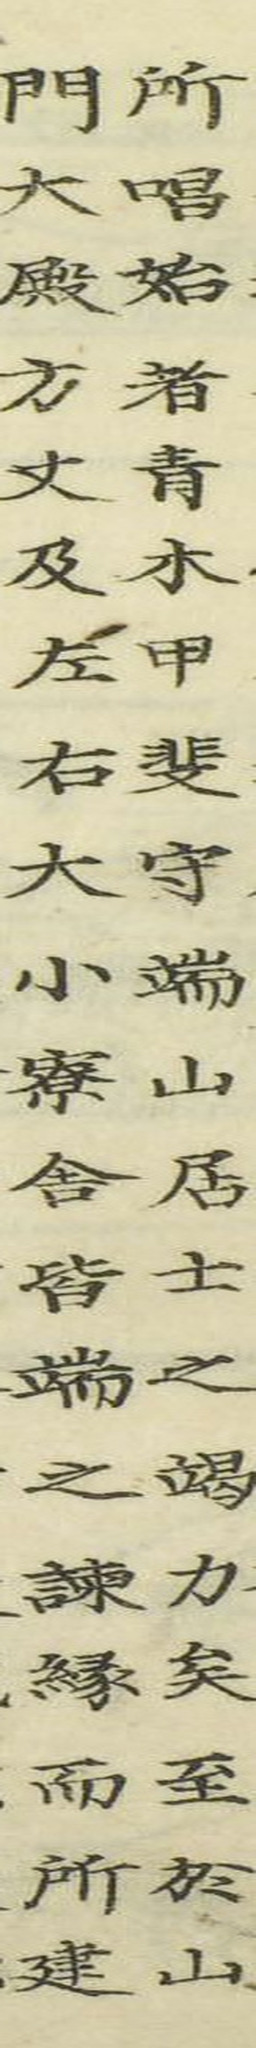門大殿方丈及左右大小寮舎皆端之諫縁而所建
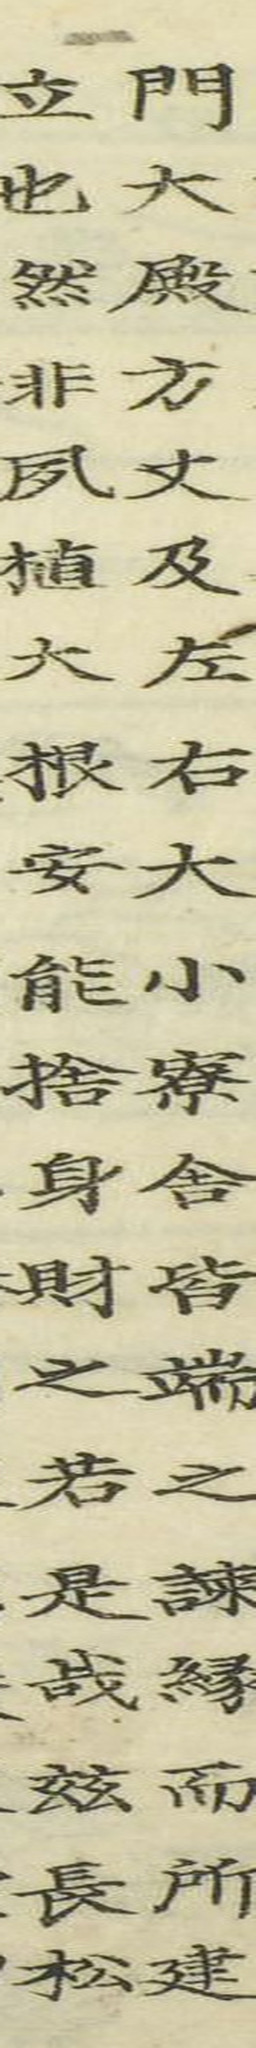立也然非夙植大根安能捨身財之若是哉玆長松
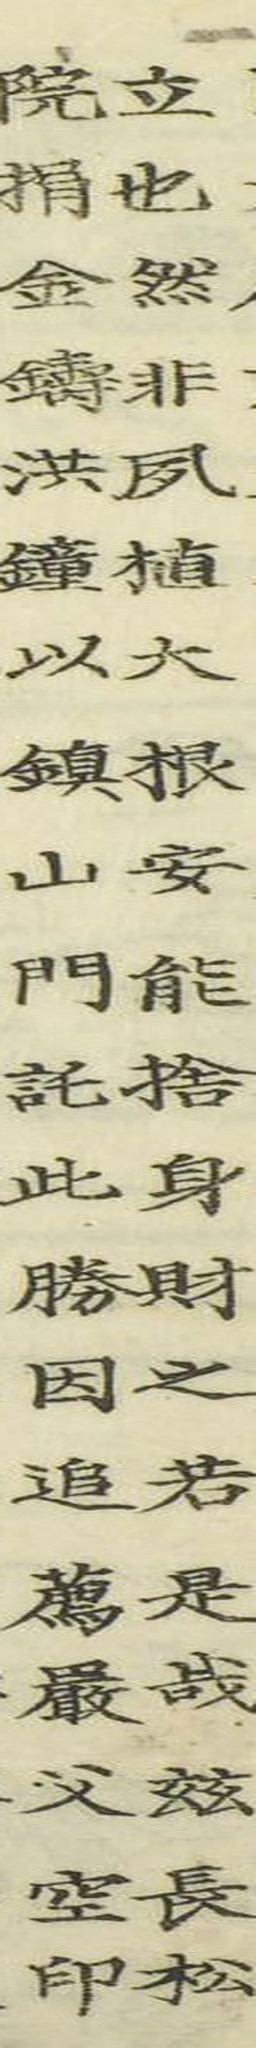院損金鑄洪鐘以鎮山門託此勝因追薦嚴父空印
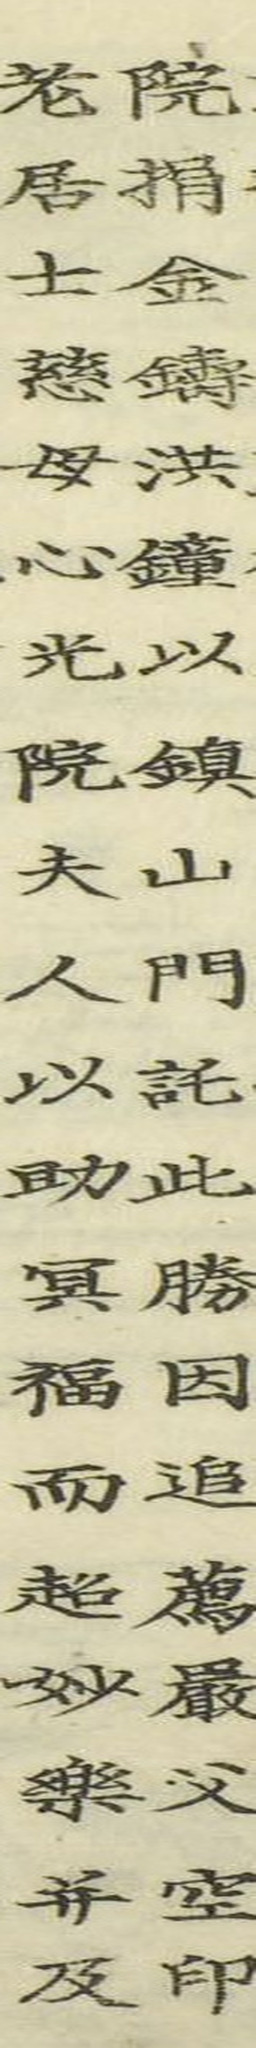老居士慈母心光院夫人以助冥福而超妙樂并及
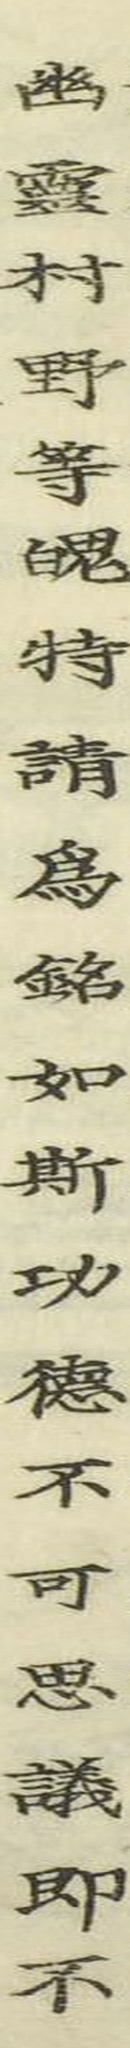幽靈村野等魄特請爲銘如斯功德不可思議即不
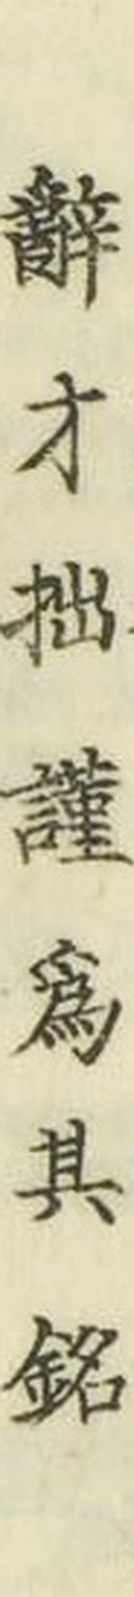辭才拙謹爲其銘
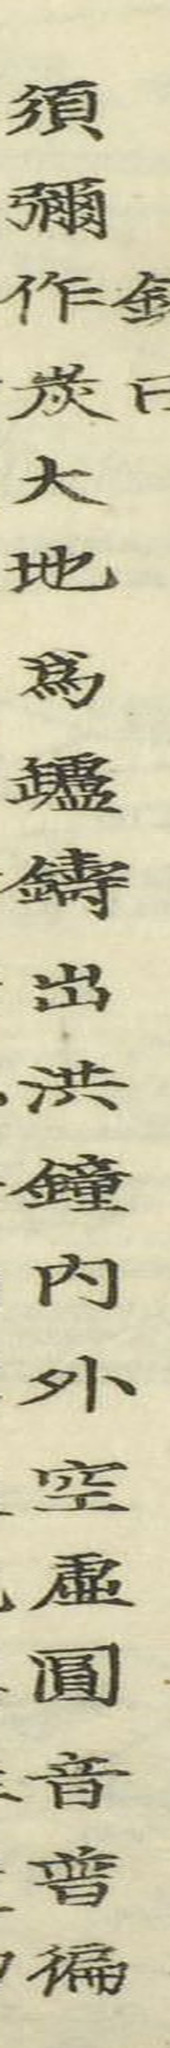須彌作炭大地爲罏鑄出洪鐘内外空虛圓音普徧
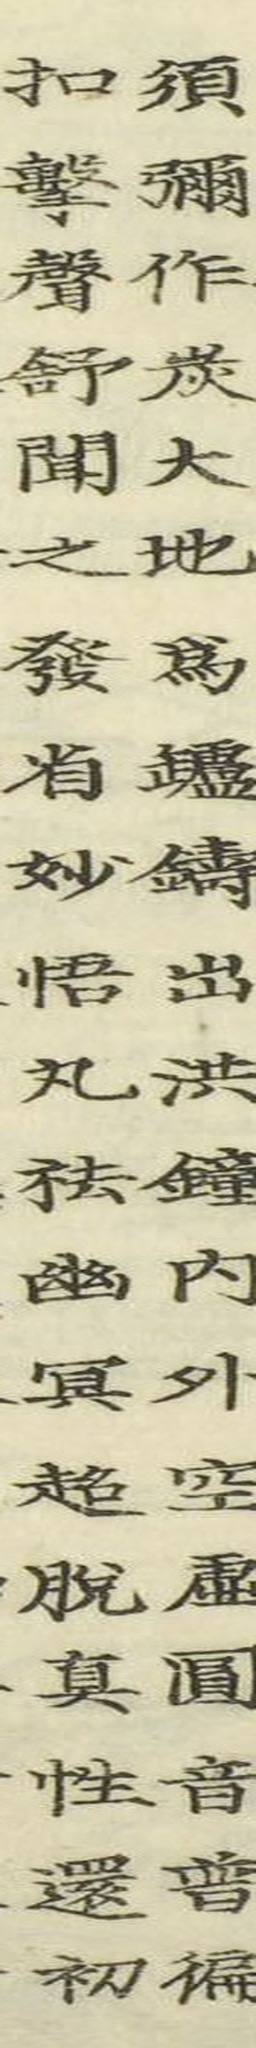扣擊聲舒聞之發省妙悟丸袪幽冥超脫真性還初
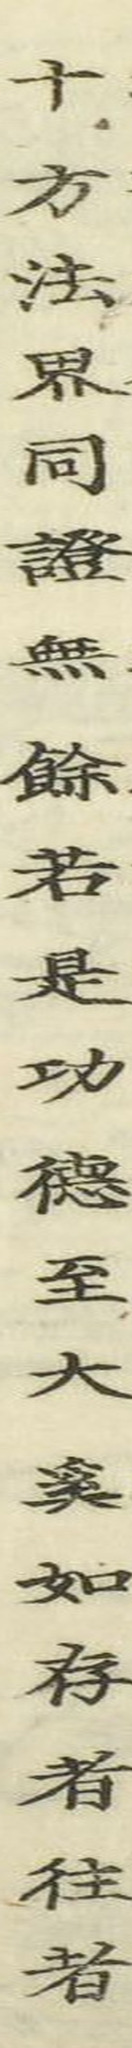十方法界同證無餘若是功德至大奚如存者往者
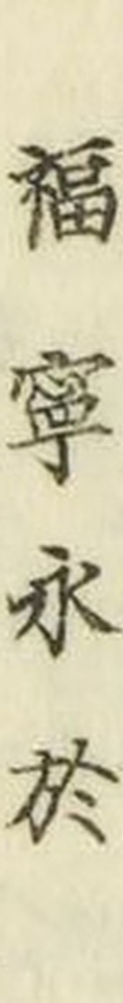福寧永於
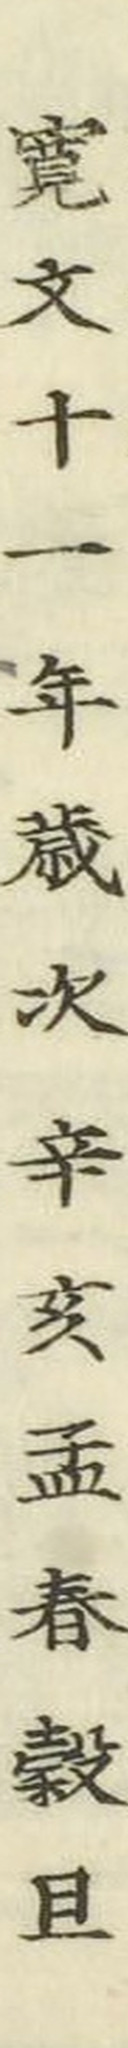寛文十一年歳次辛亥孟春穀旦
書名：江戸名所図会 20巻 巻之7
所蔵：東京学芸大学教育コンテンツアーカイブ
